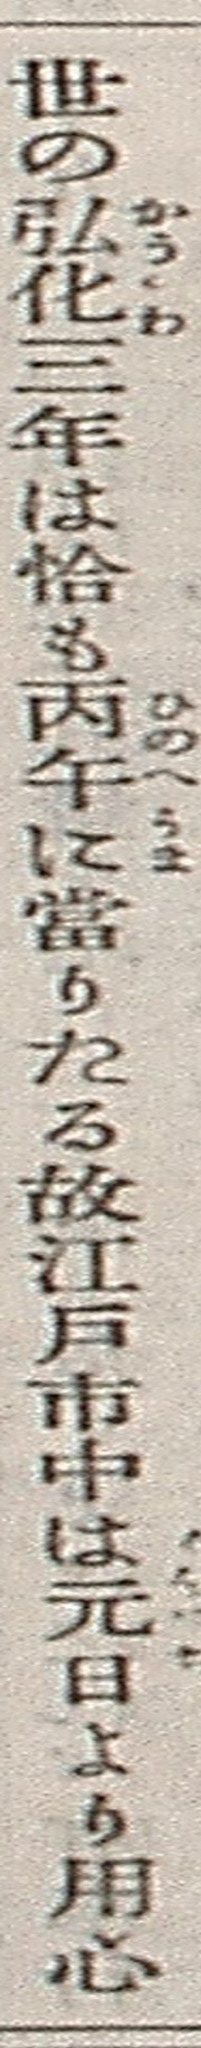世の弘化三年は恰も丙午に当りたる故江戸市中は元日より用心

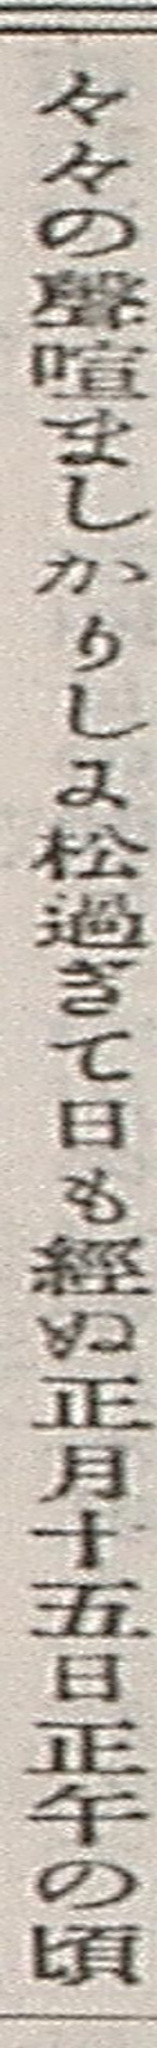々々の声喧ましかりしに松過ぎて日も経ぬ正月十五日正午の頃
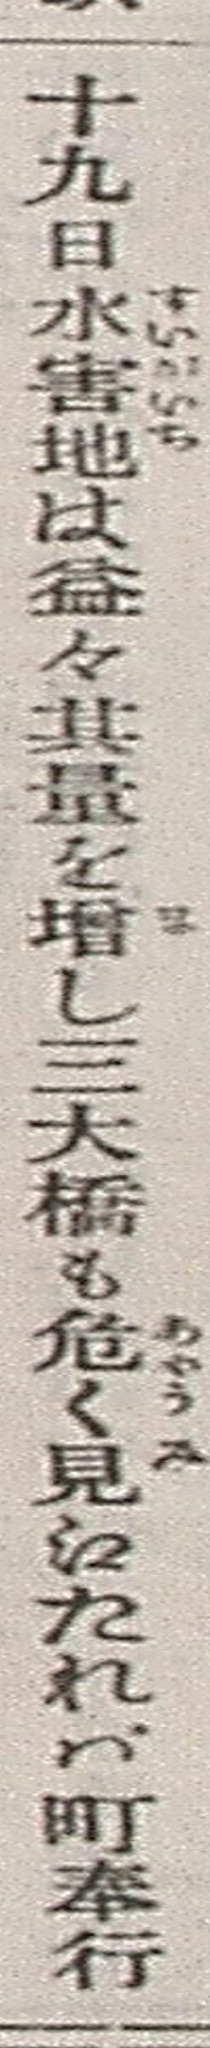十九日水害地は益々其量を増し三大橋も危く見えたれば町奉行
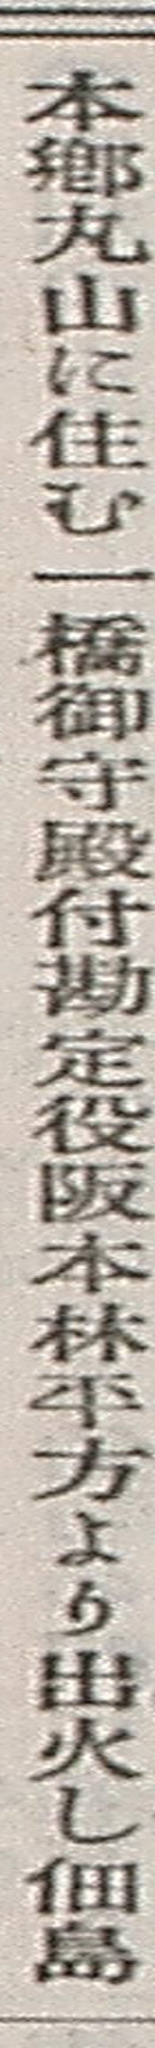本郷丸山に住む一橋御守殿付勘定役坂本平方より出火し佃島
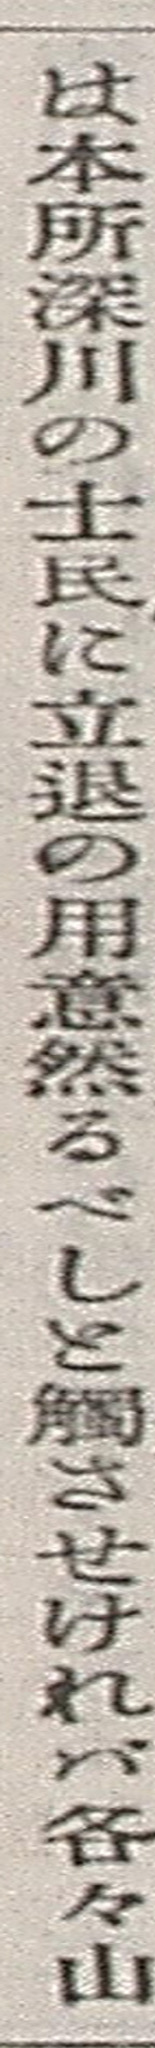は本所深川の士民に立退の用意然るべしと触させければ各々山
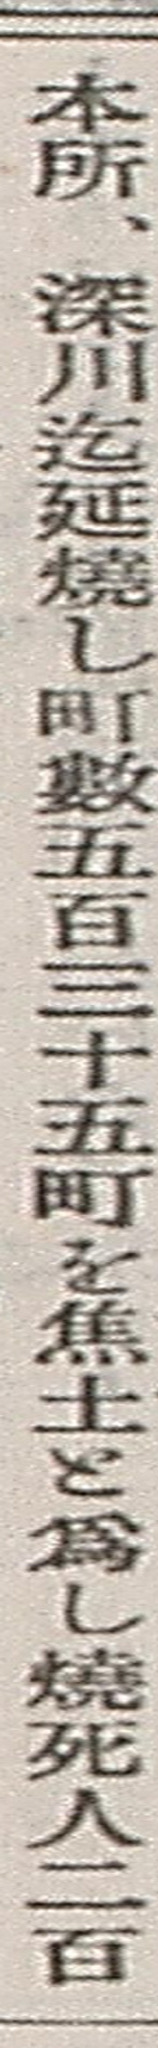本所、深川迄延焼し町数五百三十五町を焦土と為し焼死人二百
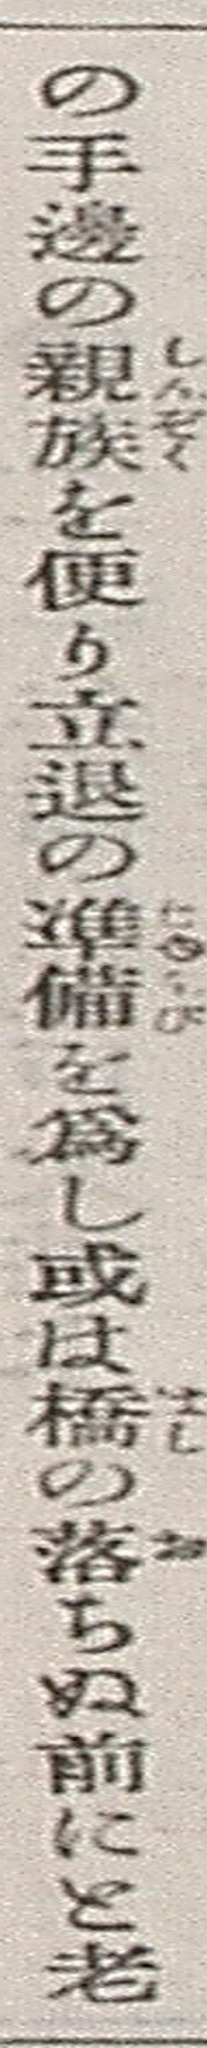の手辺の親族を便り立退の準備を為し或は橋の落ちぬ前にと老
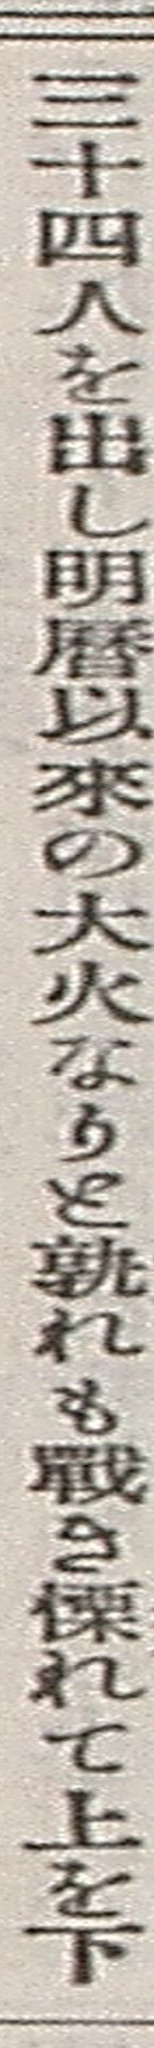三十四人を出し明暦以来の大火なりと孰れも戦き慄れて上を下
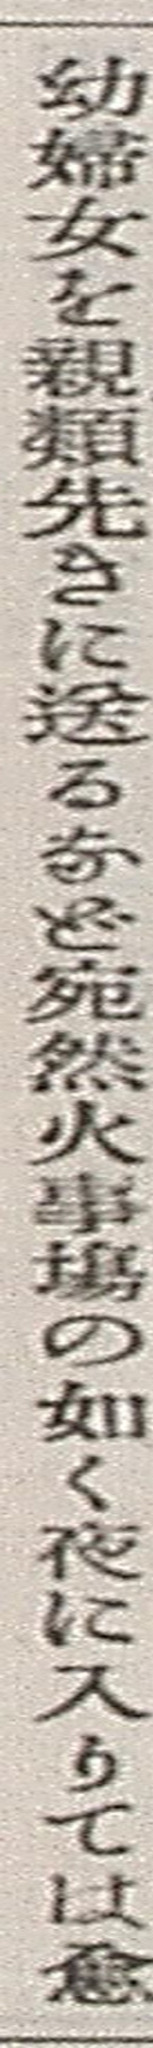幼婦女を親類先きに送るなど宛然火事場の如く夜に入りては愈
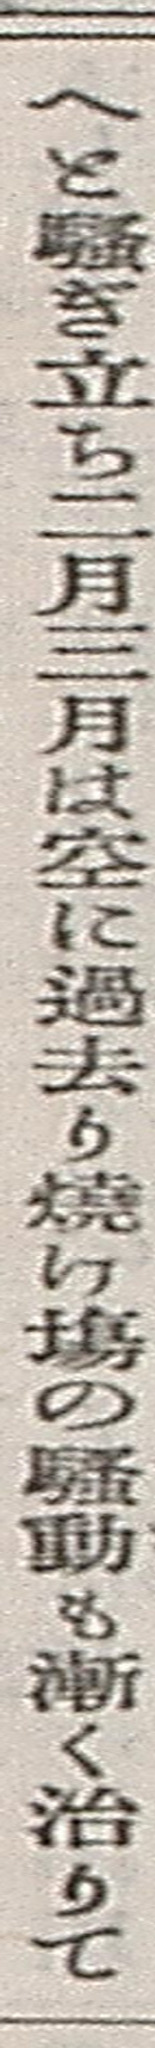へと騒ぎ立ち二月三月は空に過去り焼け場の騒動も漸く治りて
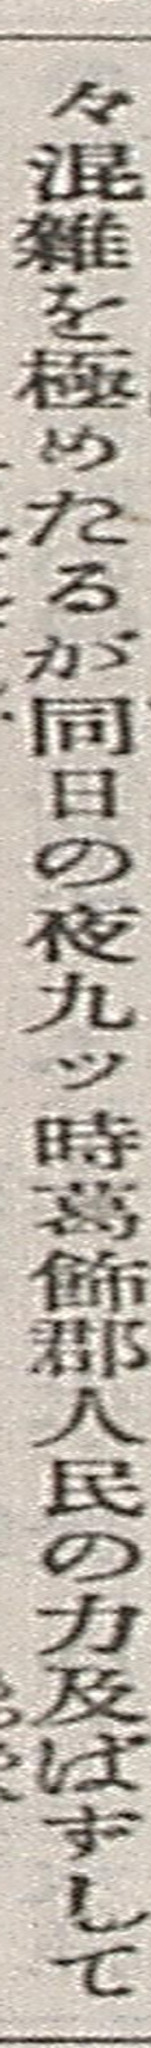々混雑を極めたるが同日の夜九ツ時葛飾郡人民の力及ばずして
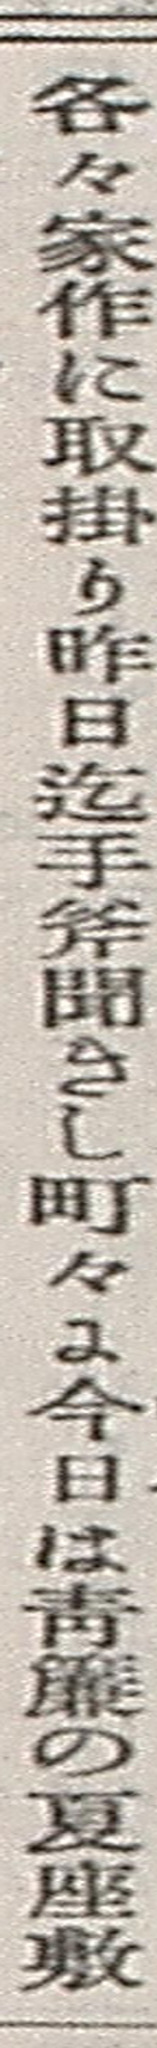各々家作に取掛り昨日迄手斧聞きし町々に今日は青簾の夏座敷
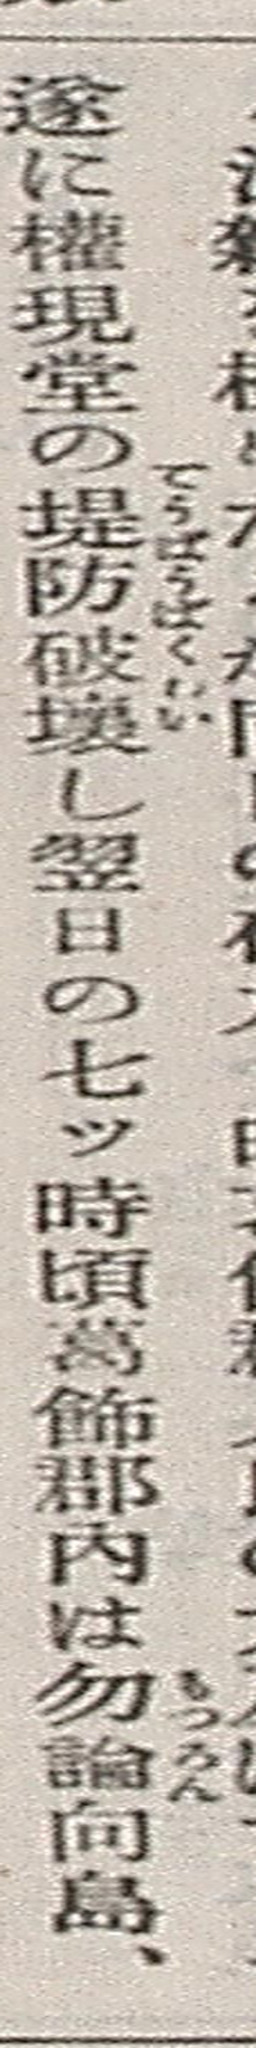遂に権現堂の堤防破壊し翌日の七ツ時頃葛飾郡内は勿論向島、
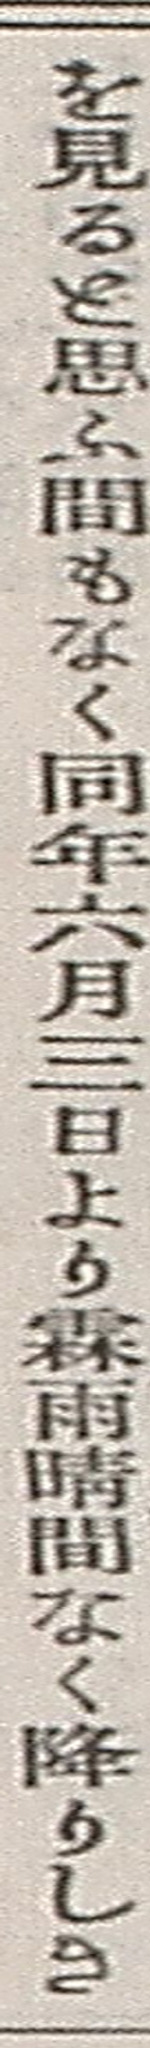を見ると思ふ間もなく同年六月三日より霖雨晴間なく降りしき
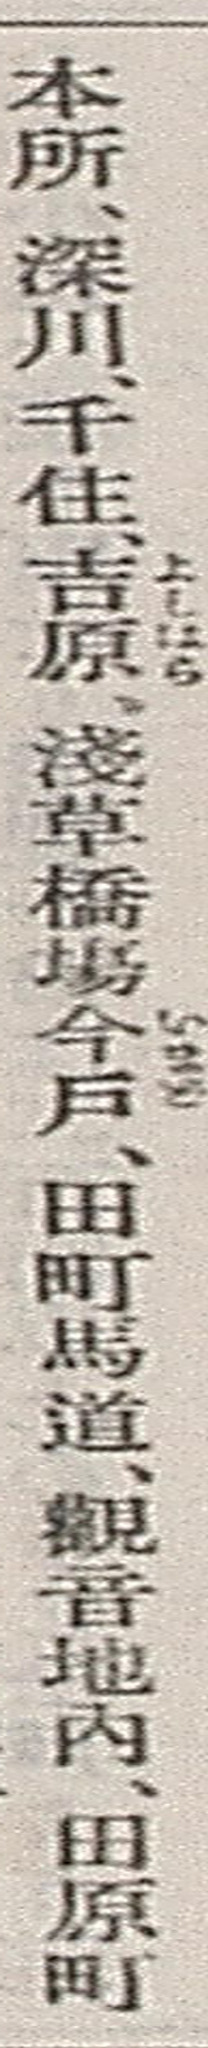本所、深川、千住、吉原、浅草橋場今戸、田町馬場、観音地内、田原町
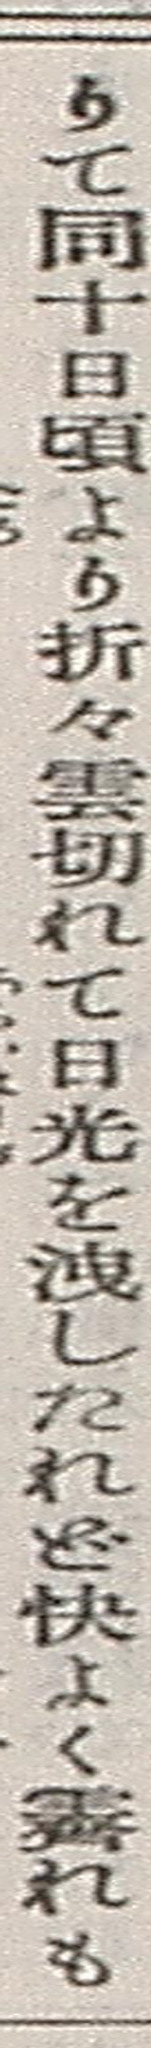りて同十日頃より折々雲切れて日光を洩したれど快よく霽れも
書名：風俗畫報臨時増刊第百二十四號　洪水地震被害録（上）
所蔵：東京大学地震研究所図書室 Earthquake Research Institute Library, The University of Tokyo, JAPAN
